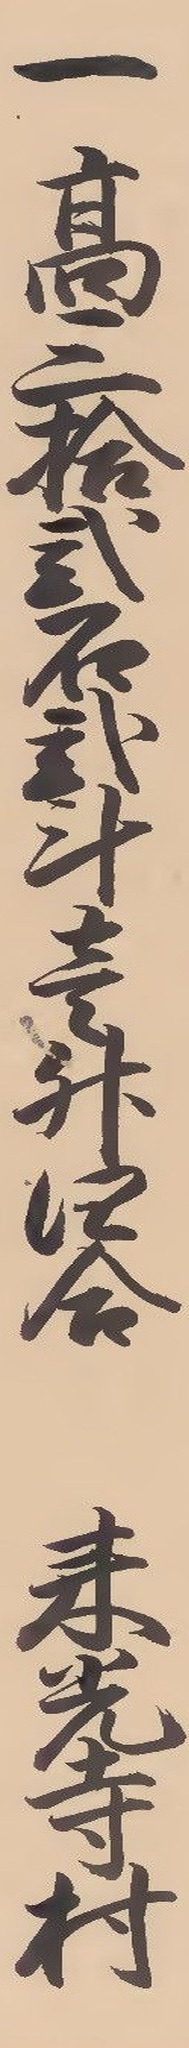一髙三拾弐石弐斗壱升四合来光寺村

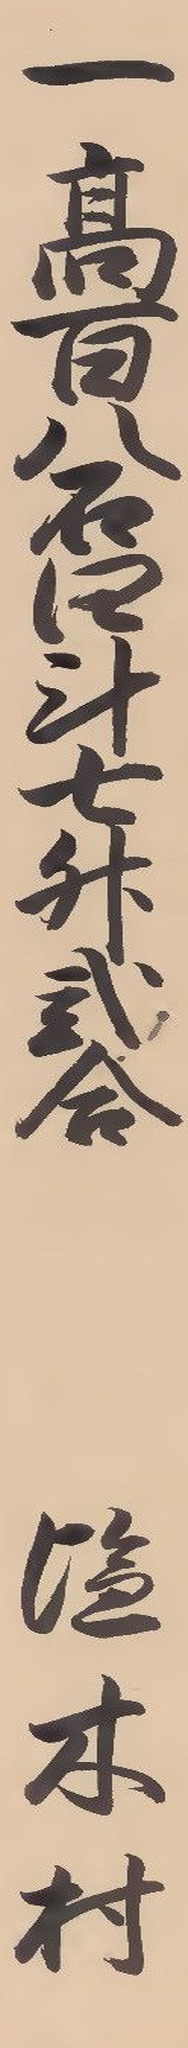一髙百八石四斗七升弐合塩木村
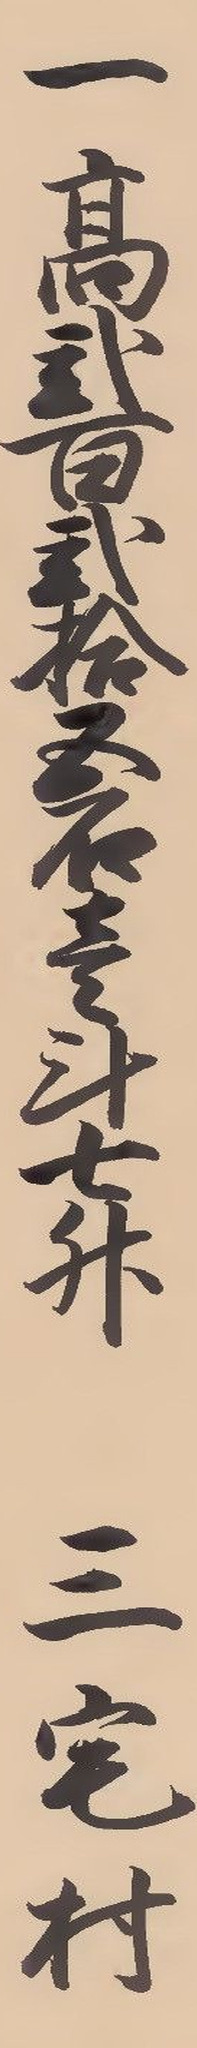一髙弐百弐拾五石壱斗七升三宅村
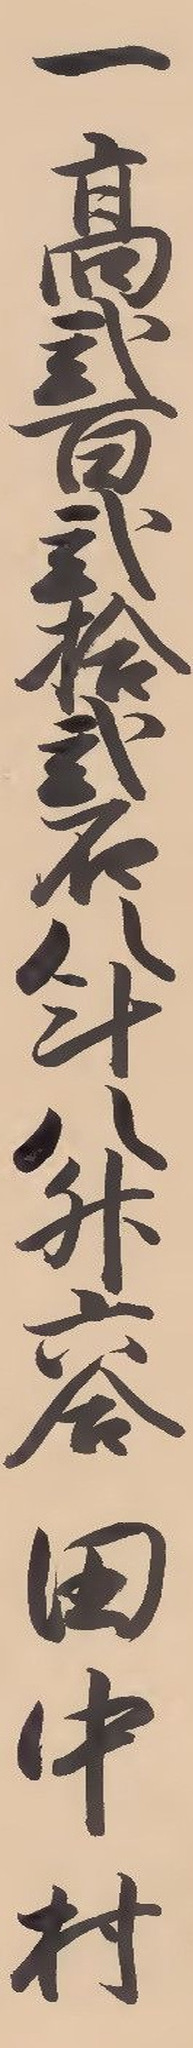一髙弐百弐拾弐石八斗八升六合田中村
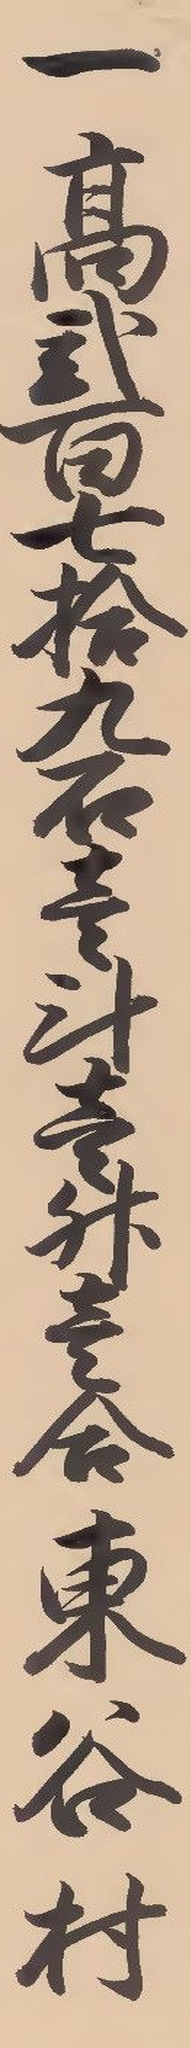一髙弐百七拾九石壱斗壱升壱合東谷村
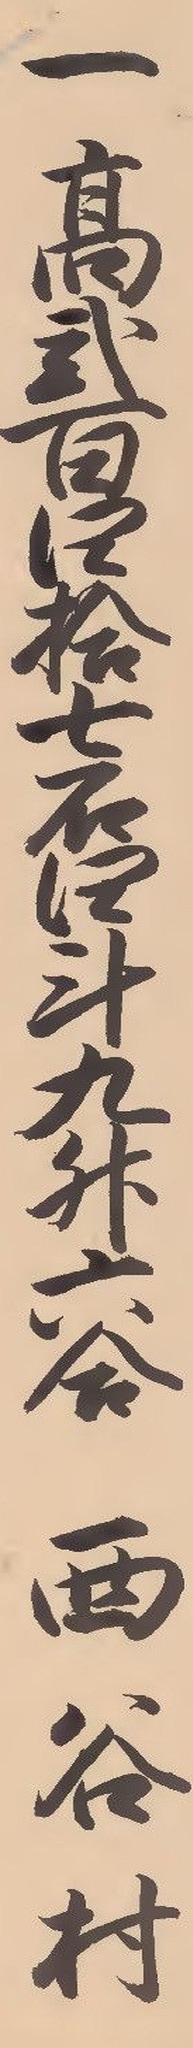一髙弐百四拾七石四斗九升六合西谷村
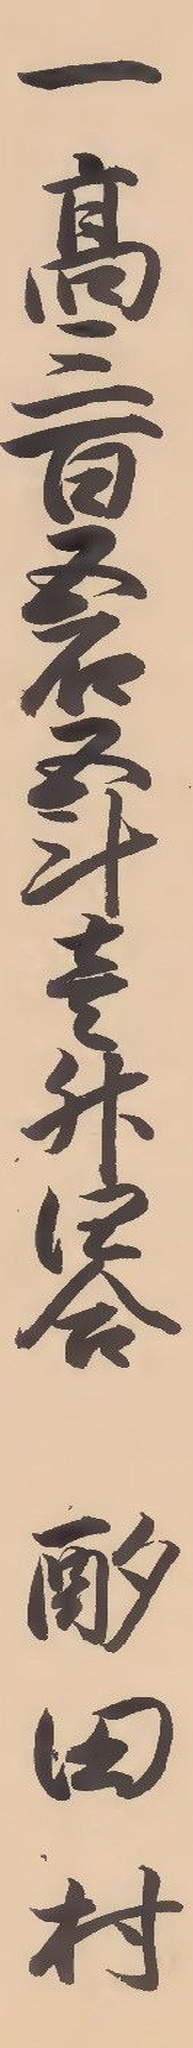一髙三百五石五斗壱升四合酌田村
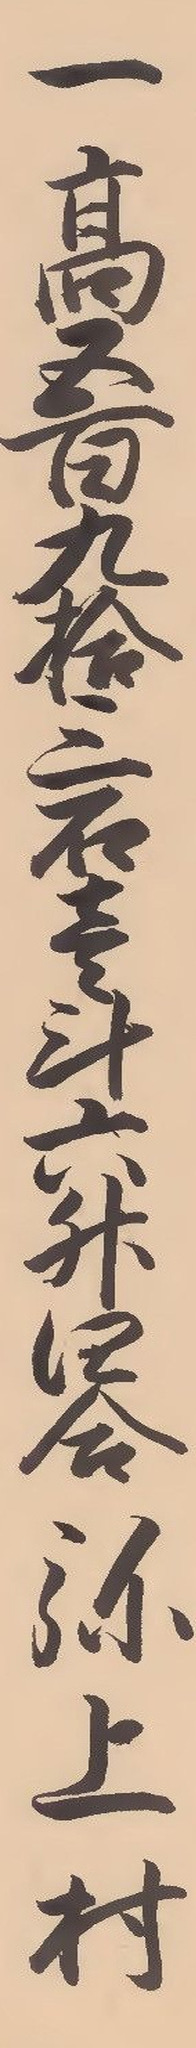一髙五百九拾三石壱斗六升四合弥上村
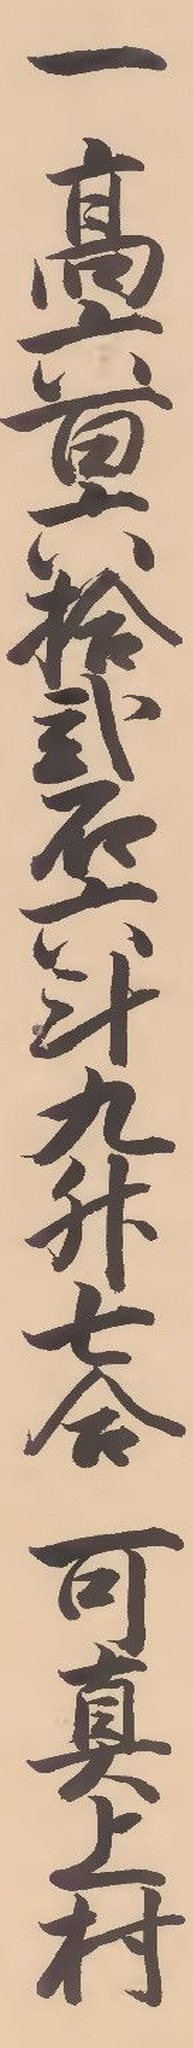一髙六百六拾弐石六斗九升七合可真上村

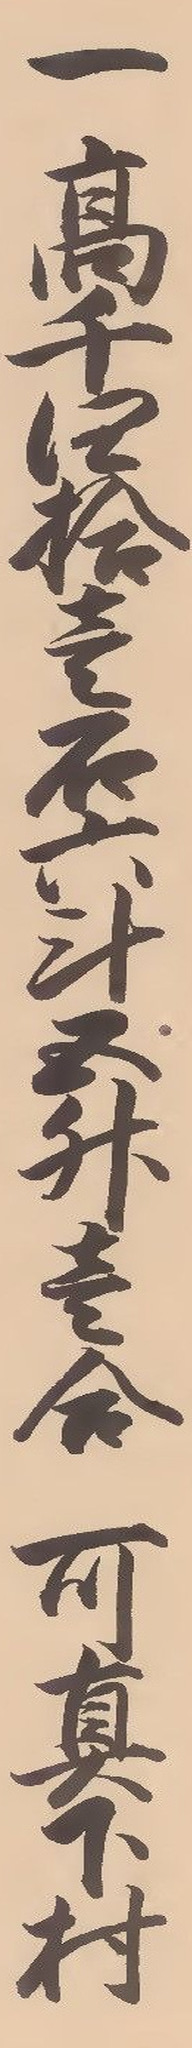一髙千四拾壱石六斗五升壱合可真下村
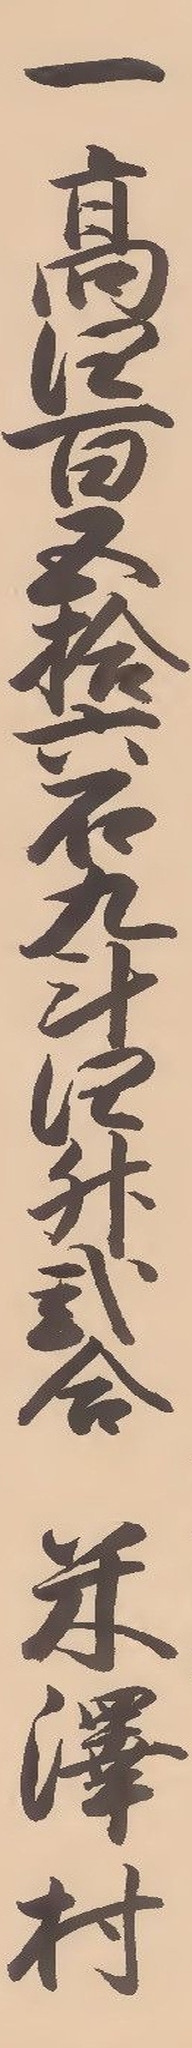一髙四百五拾六石九斗四升弐合米澤村
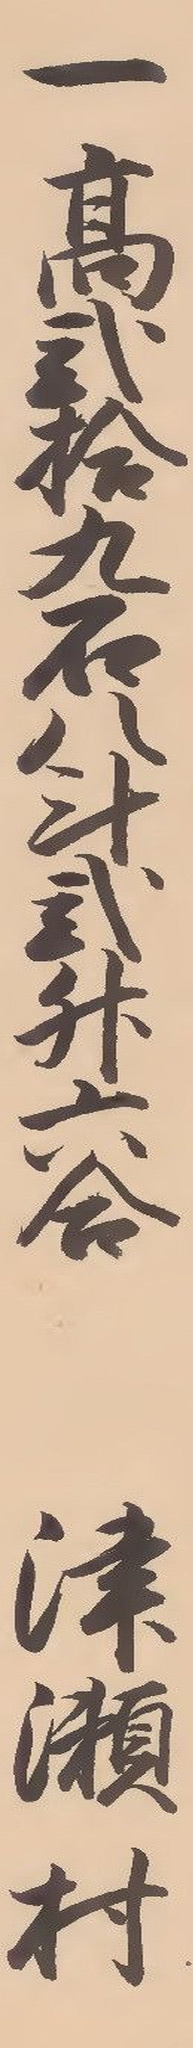一髙弐拾九石八斗弐升六合津瀬村
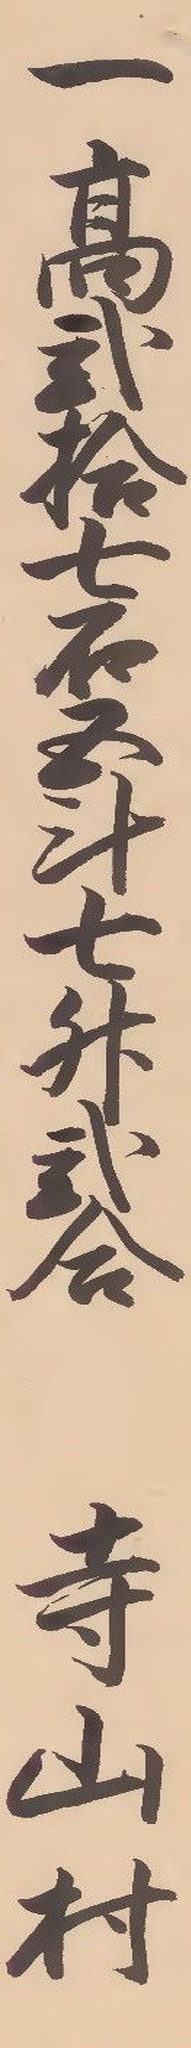一髙弐拾七石五斗七升弐合寺山村
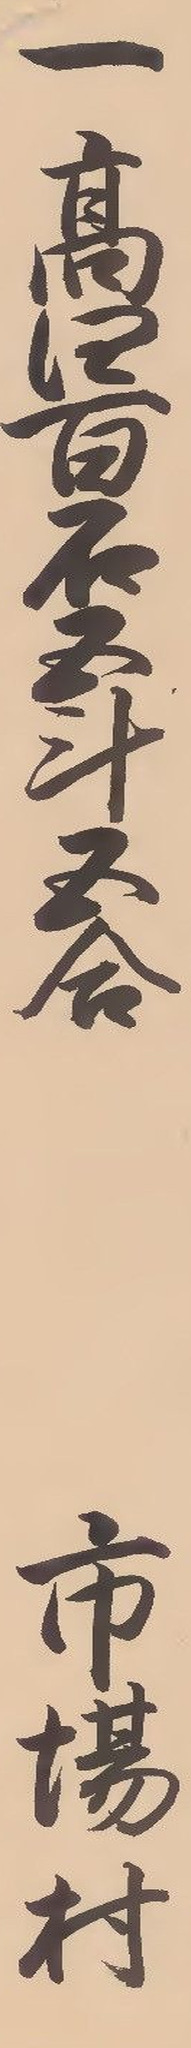一髙四百石五斗五合市場村
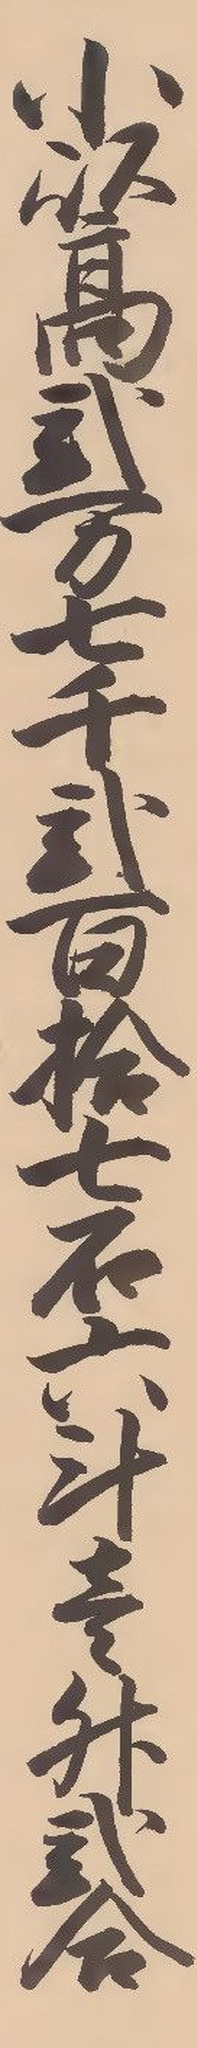小以髙弐万七千弐百拾七石六斗壱升弐合

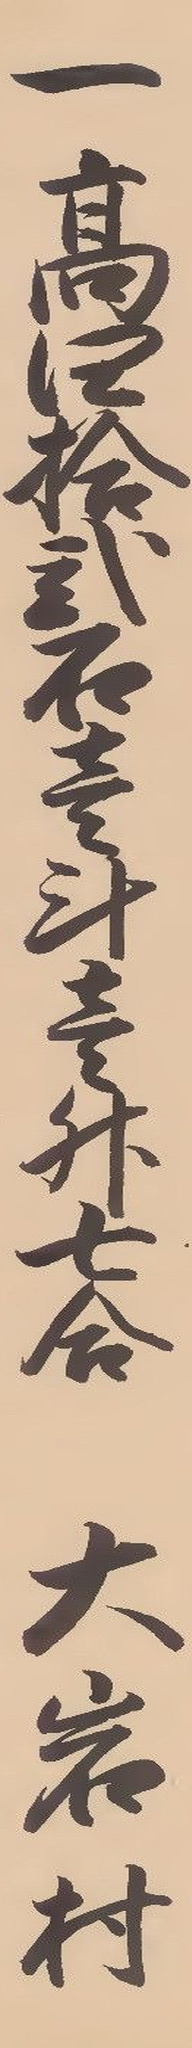一髙四拾弐石壱斗壱升七合大岩村
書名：備前国郷帳
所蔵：国立公文書館 National Archives of Japan
